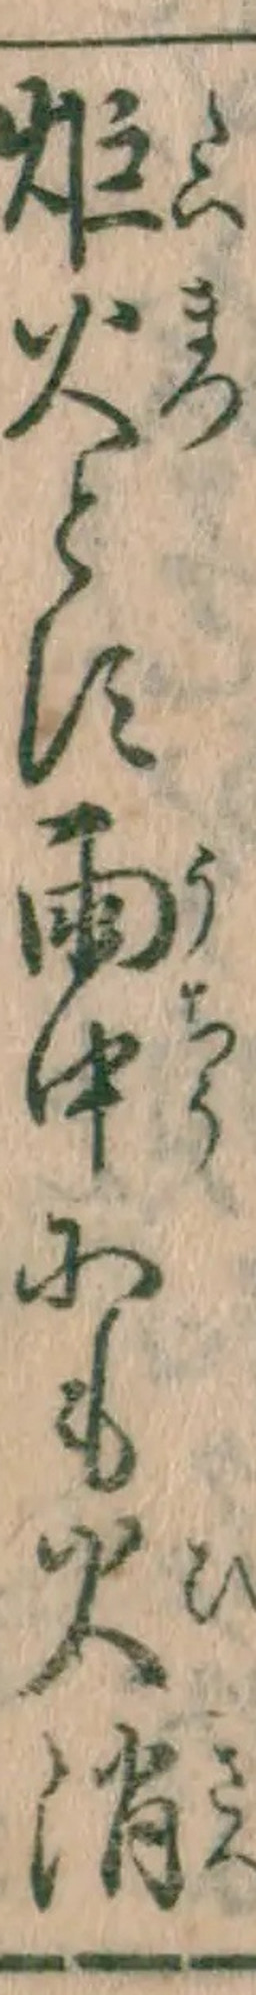炬火とす雨中にも火消
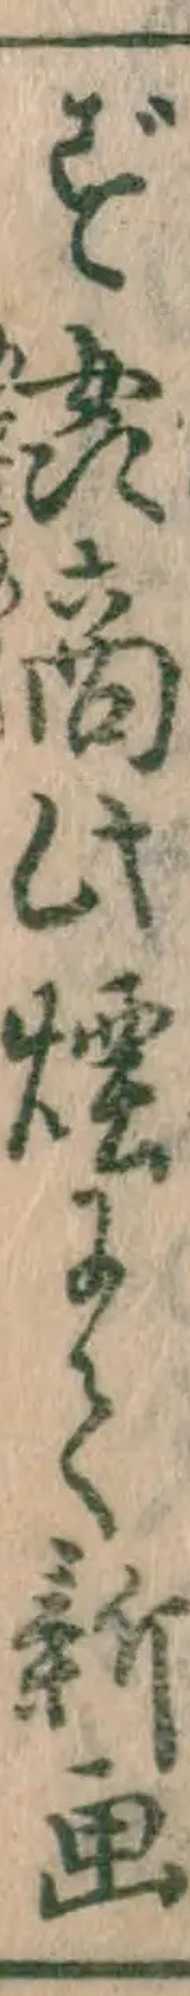ず姦商此煙にて新画
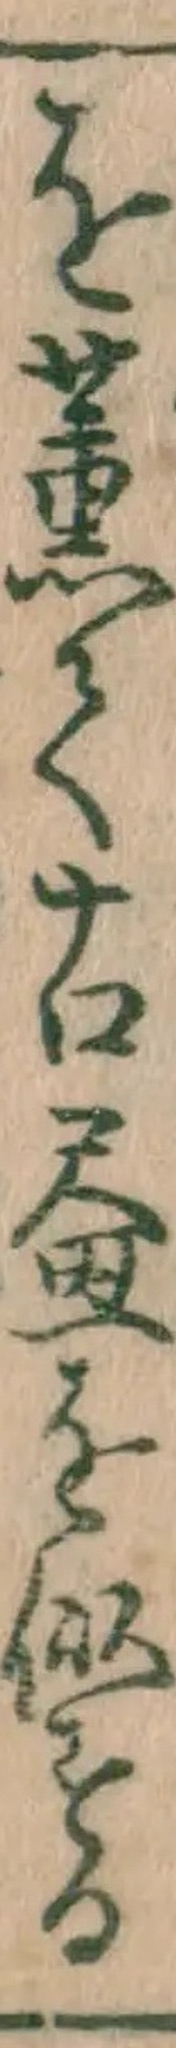を薫て古画を似する
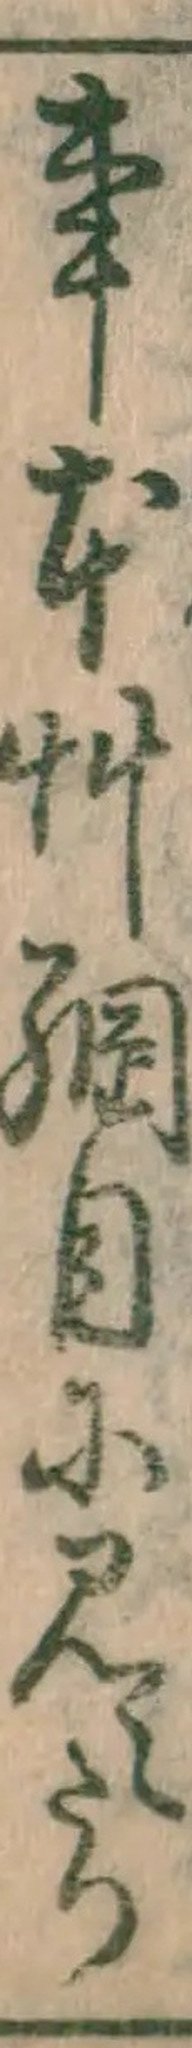事本草綱目に見えたり
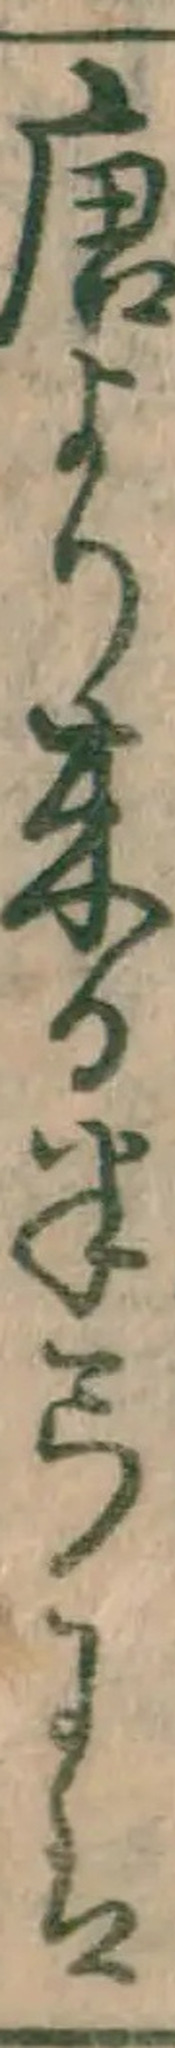唐より来る半弓には

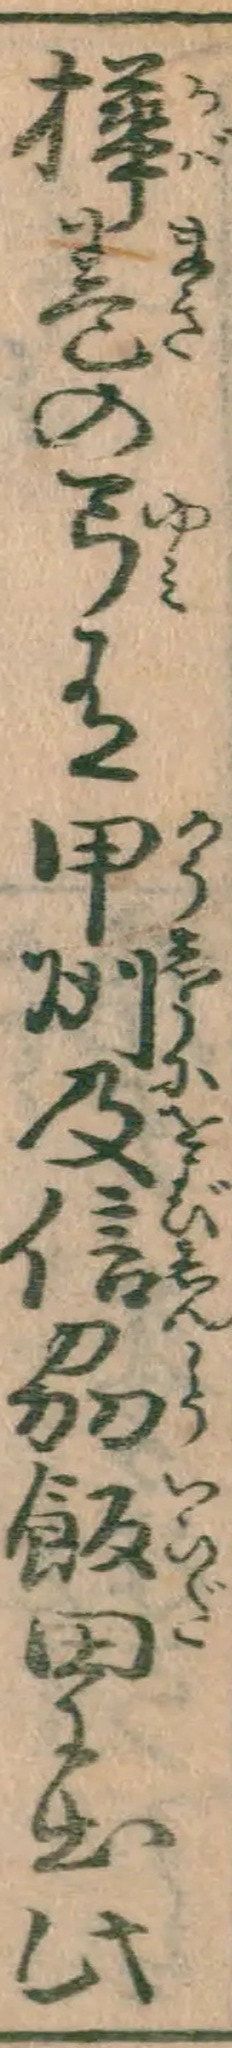樺巻の弓有甲州及信州飯田に出此
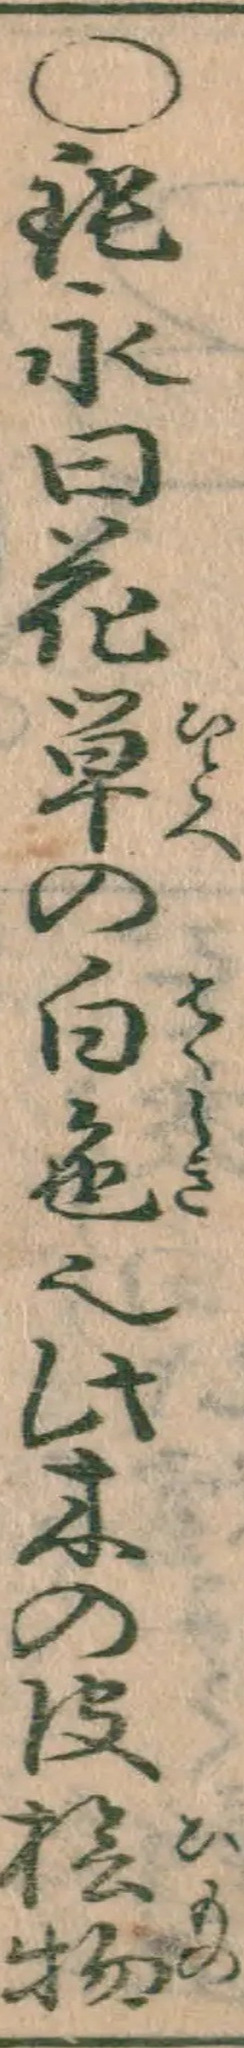○鈍永曰花単の白色也此木の皮桧物
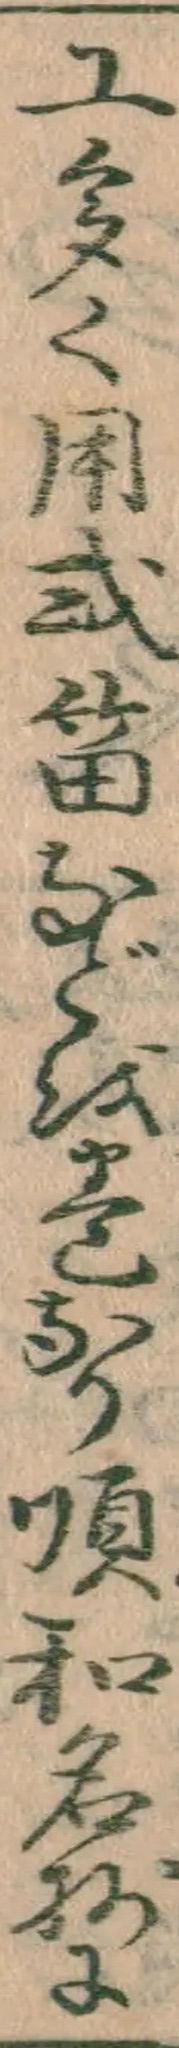工多く用或笛などを巻なり順和名抄に
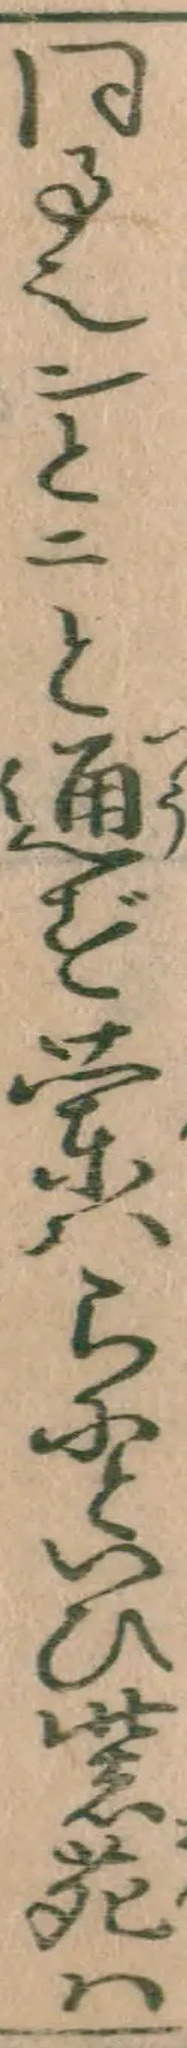同事也ンとニと通ず蘭はらにといひ紫苑は
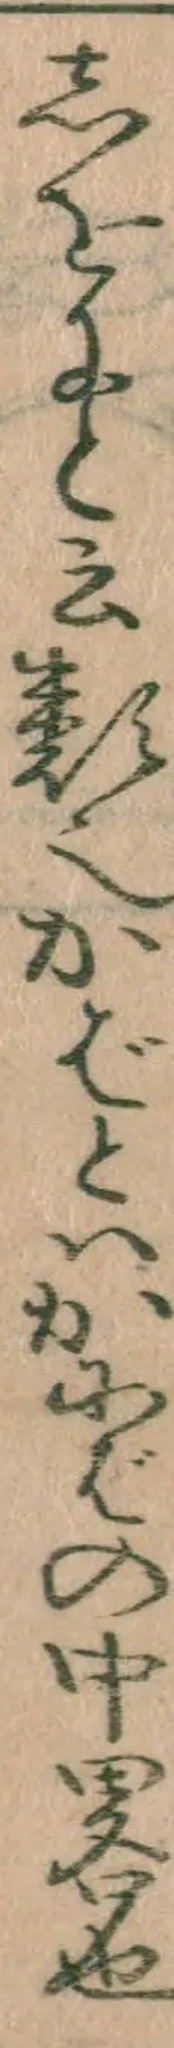しをにと云類也かばとはかにばの中略也
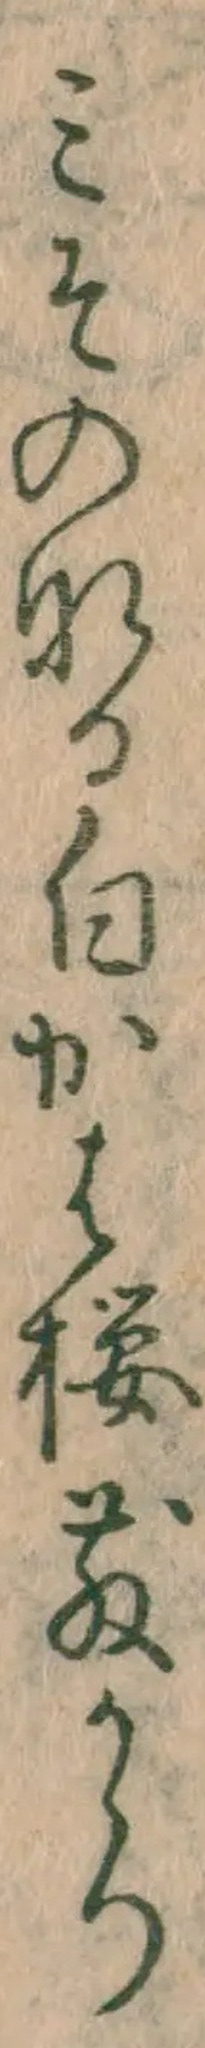みそのなる白かは桜散かゝり
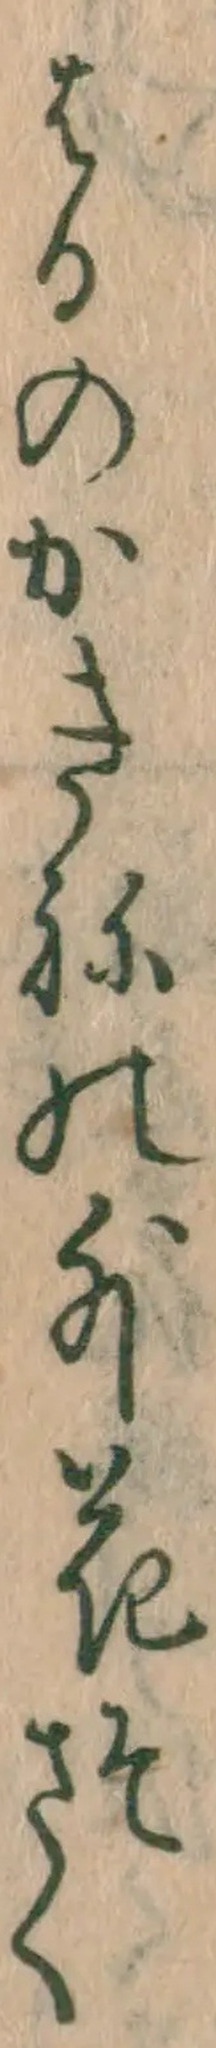はるのかきねの外花そさく

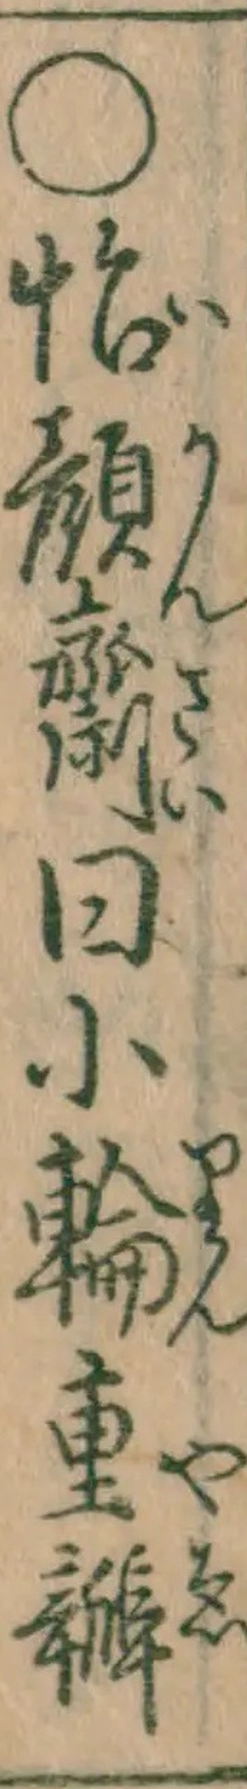○怡顔斎曰小輪重弁
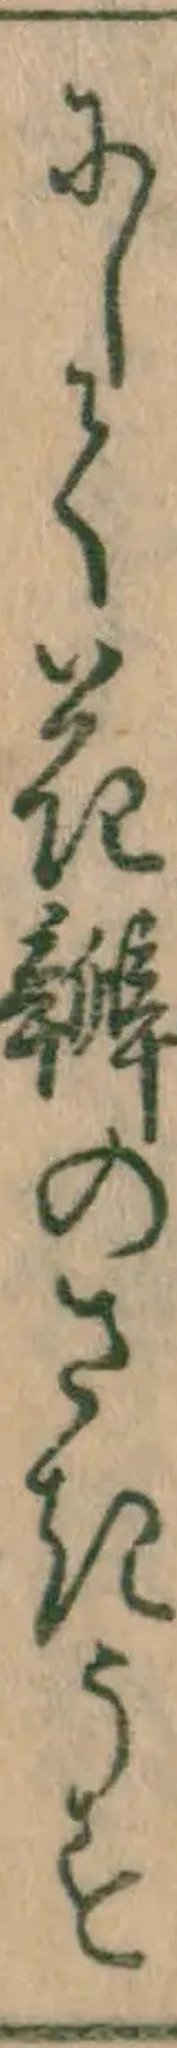にして花弁のさきうす
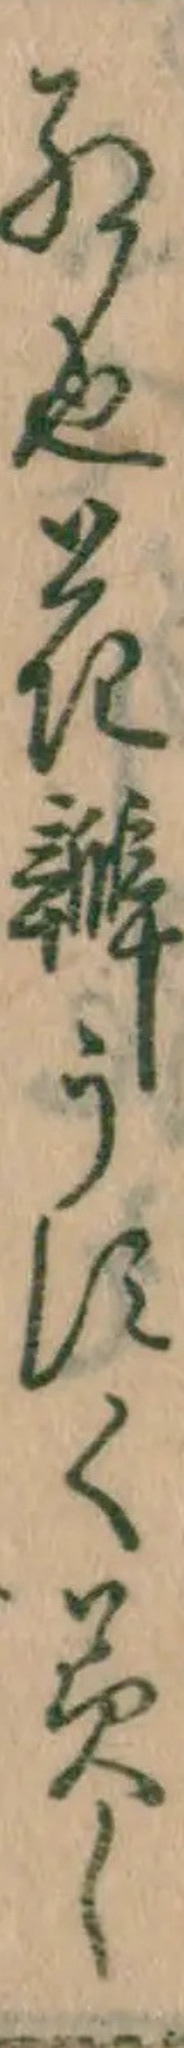紅也花弁うすく美し
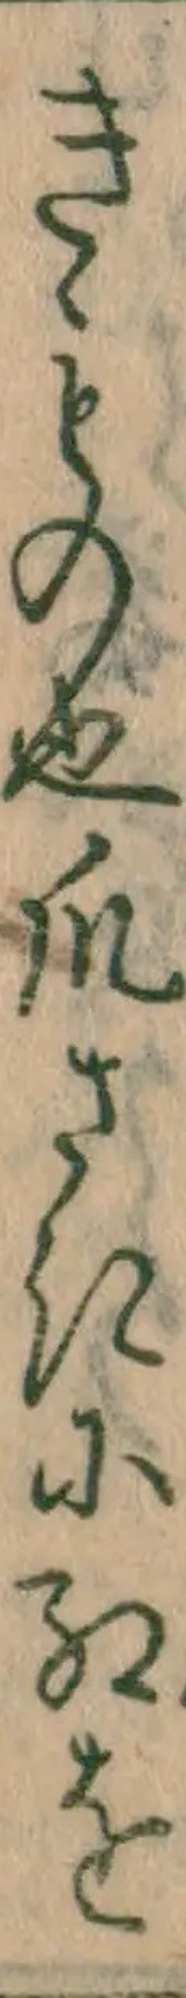きもの也爪さきに紅を
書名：怡顔齋櫻品
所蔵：国立国会図書館 National Diet Library, JAPAN
